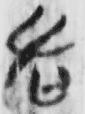左
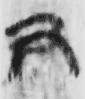尹
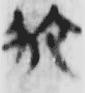{力它}
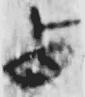貞
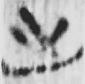出
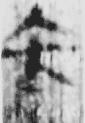內（入）
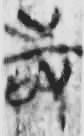○（侍）
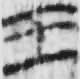王
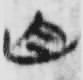自
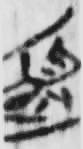○（夏）
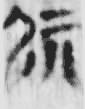𫵖
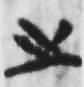之
